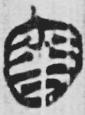审（湛）
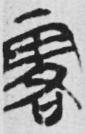○（露）
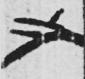之
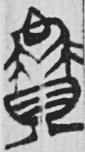賹
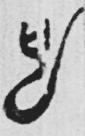也
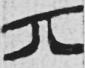亓（其）
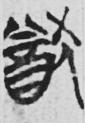猶
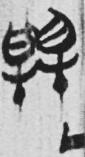與
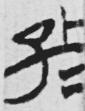孔子
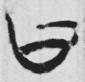曰
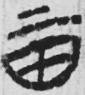○（宛）
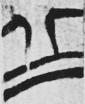丘
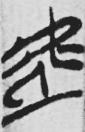○（吾）
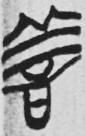善
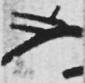之
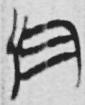於（猗）
